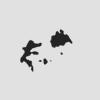隹
